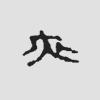火
